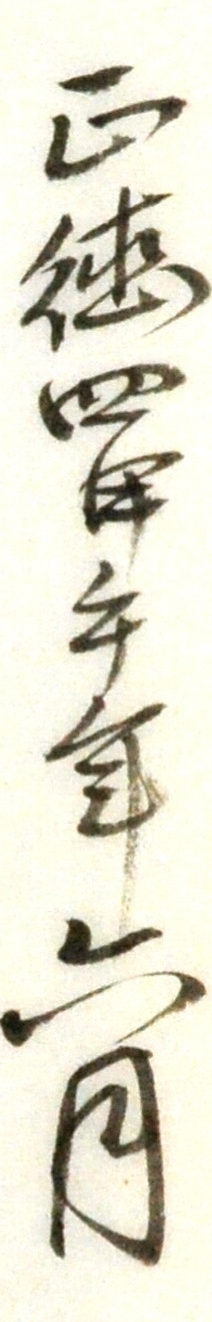正徳四甲午年六月
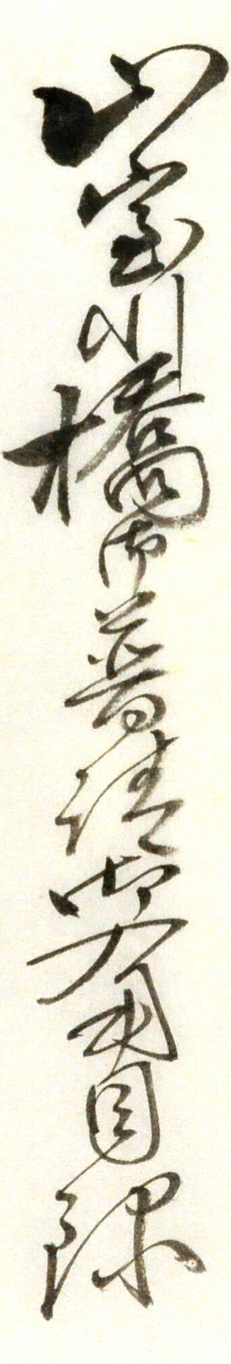山室川橋御普請御入用目録
